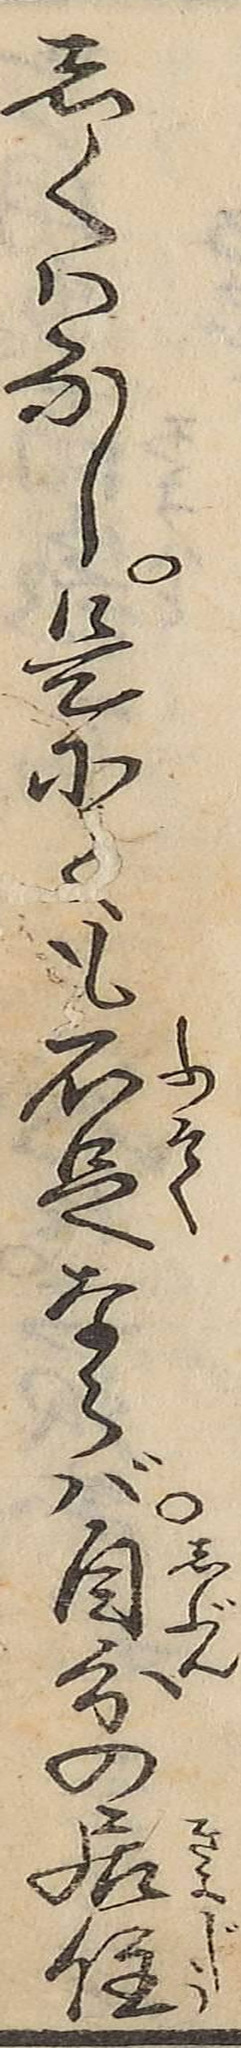しくはなし。是にても不足ならば。自分の居住

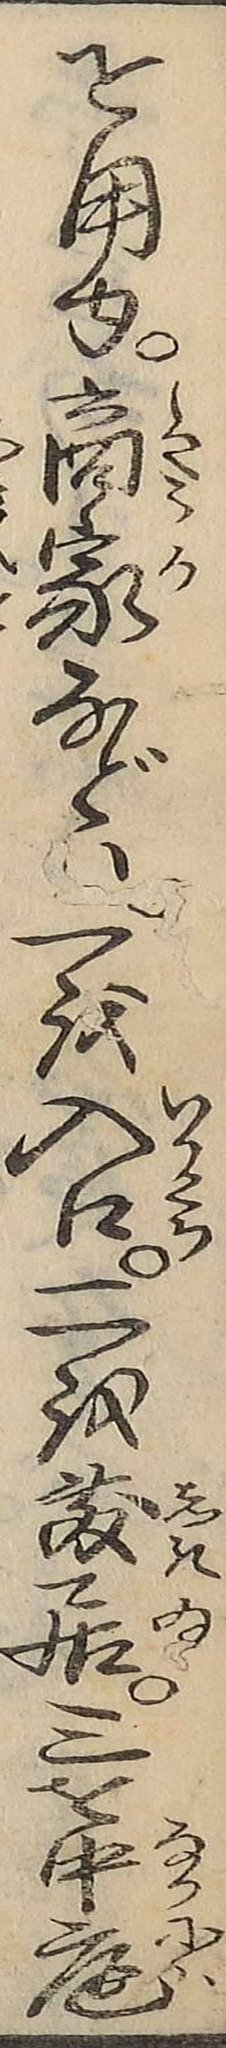を用ゆ。商家などは。一を入口。二を敷居。三を中庭
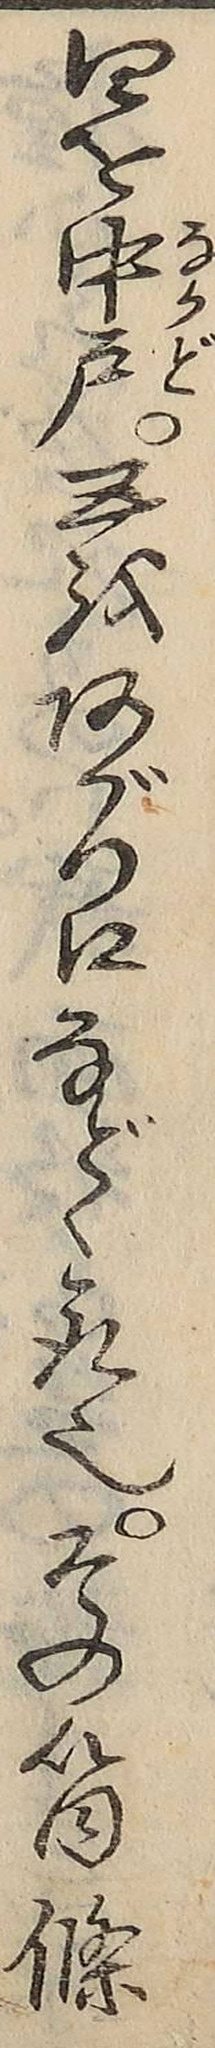四を中戸。五をあがり口などゝ取也。その箇條
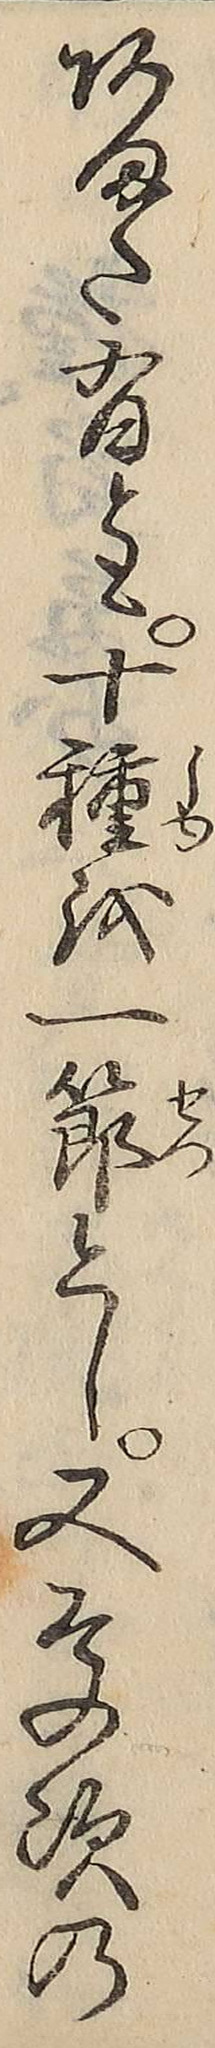あまた有とも。十種を一節とし。又その次の
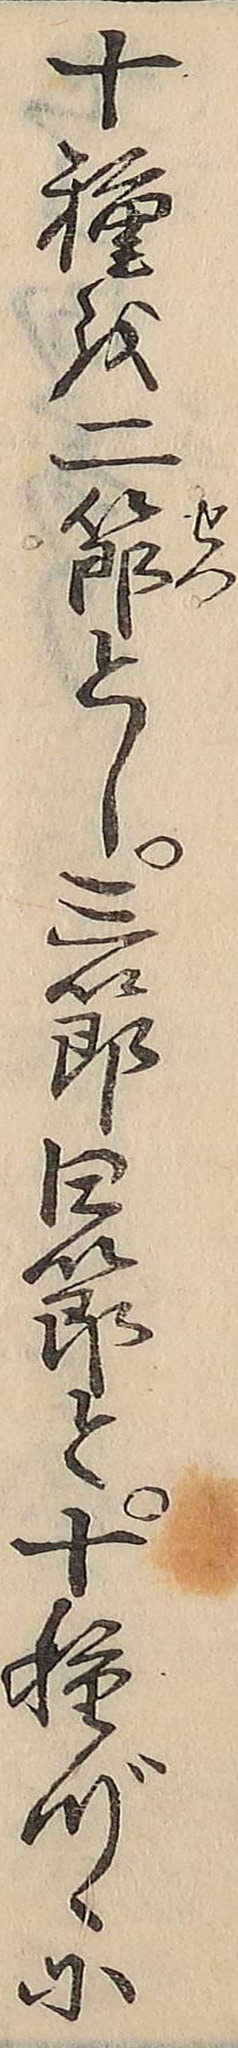十種を二節とし。三節四節と。十種づゝに
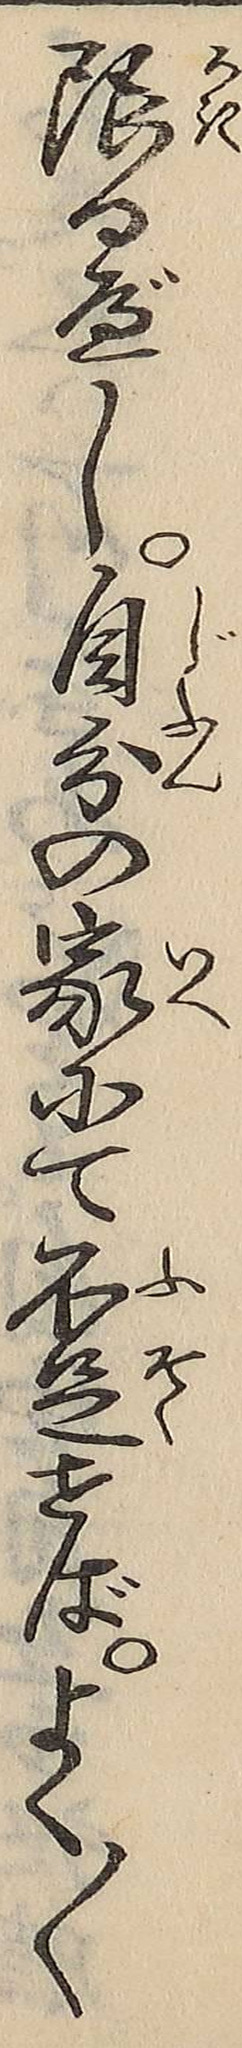限るべし。自分の家にて不足せば。よく〳〵
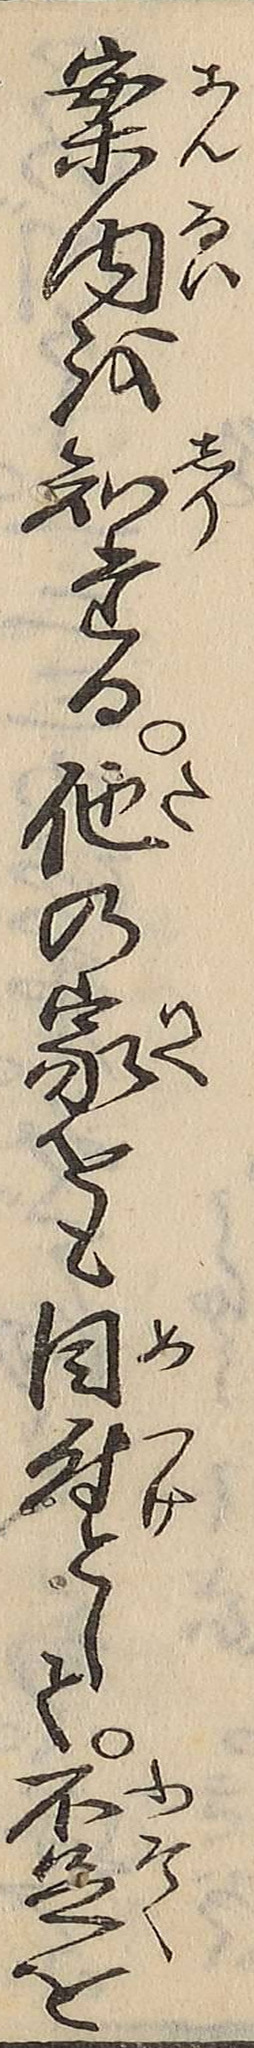案内を知たる。他の家をも目付として。不足を
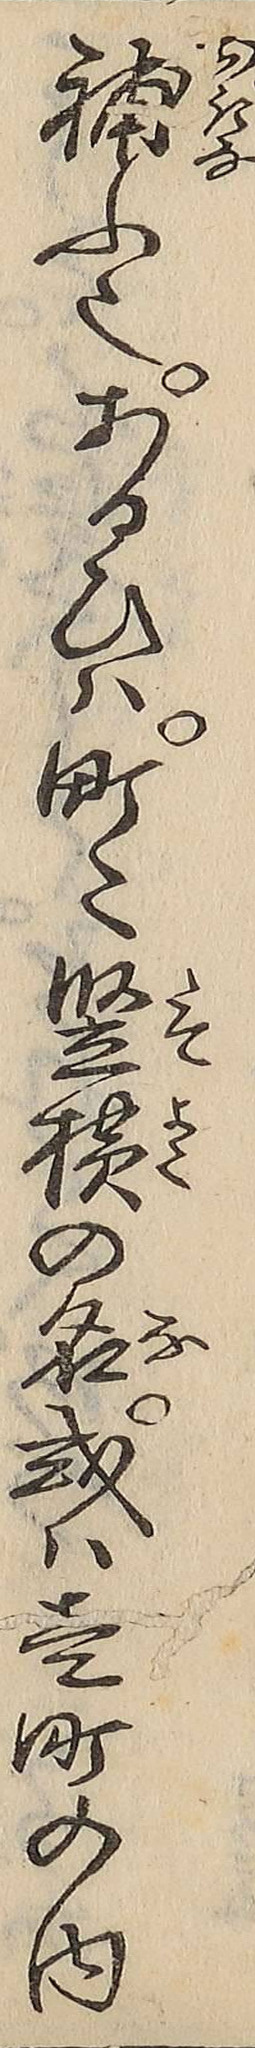補ふ也。あるひは。町々竪横の名。或は壱町の内
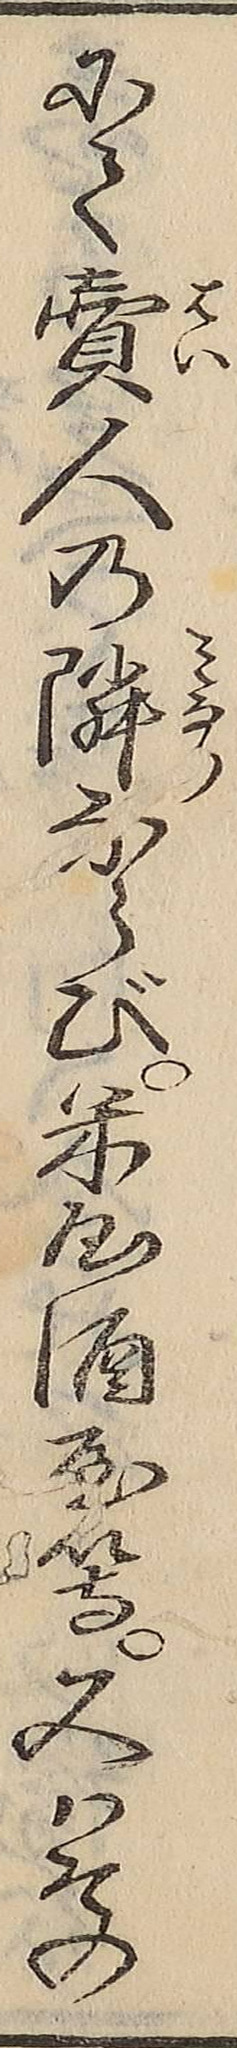にて売人の隣ならび。米屋酒屋等。又はその
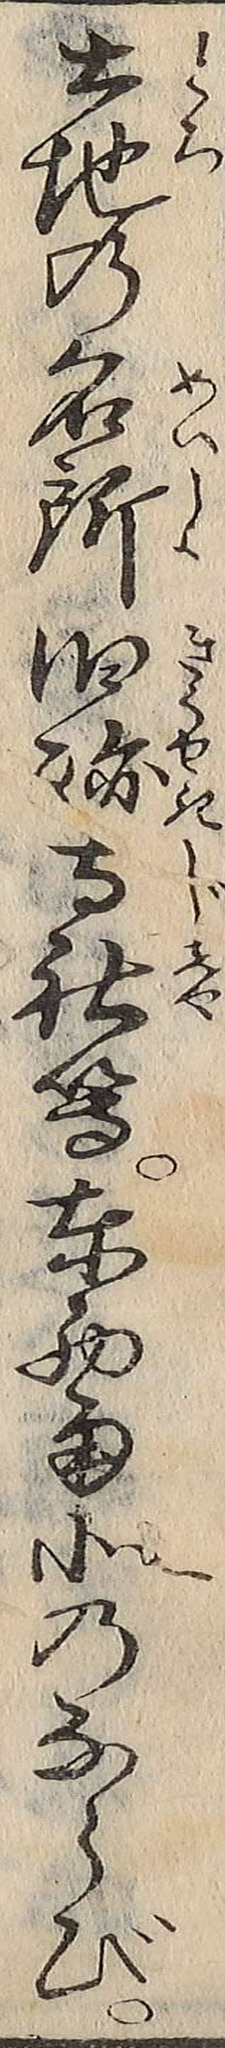土地の名所旧跡寺社等。東西南北のならび。
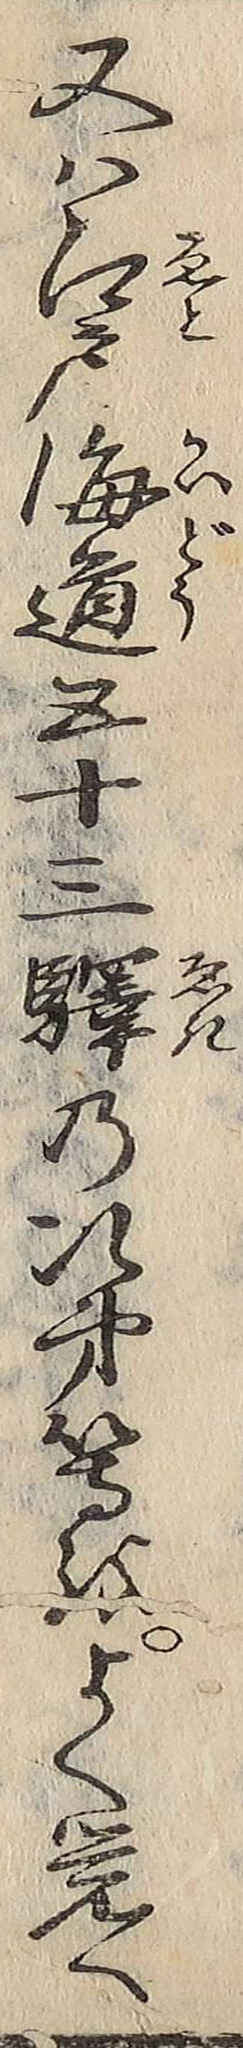又は江戸海道五十三駅の次第等を。よく覚へ
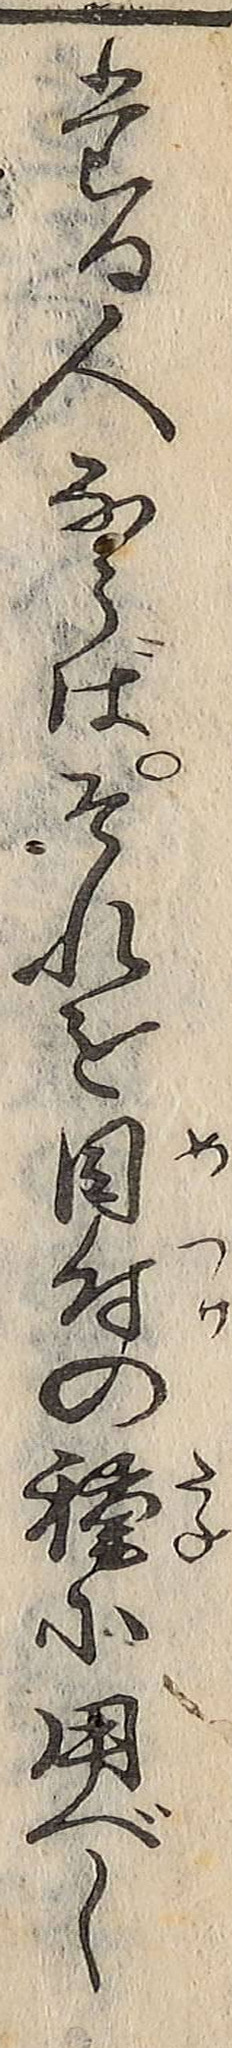たる人ならば。それを目付の種に用べし
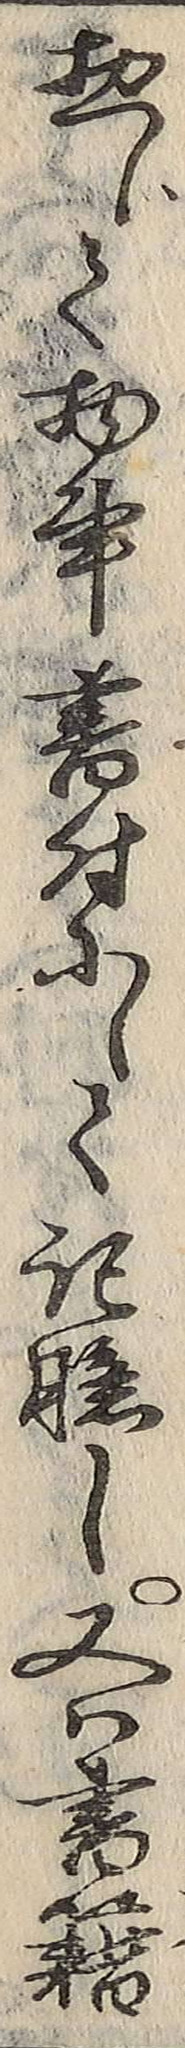惣じて物事書付にして記臆し。又は書籍
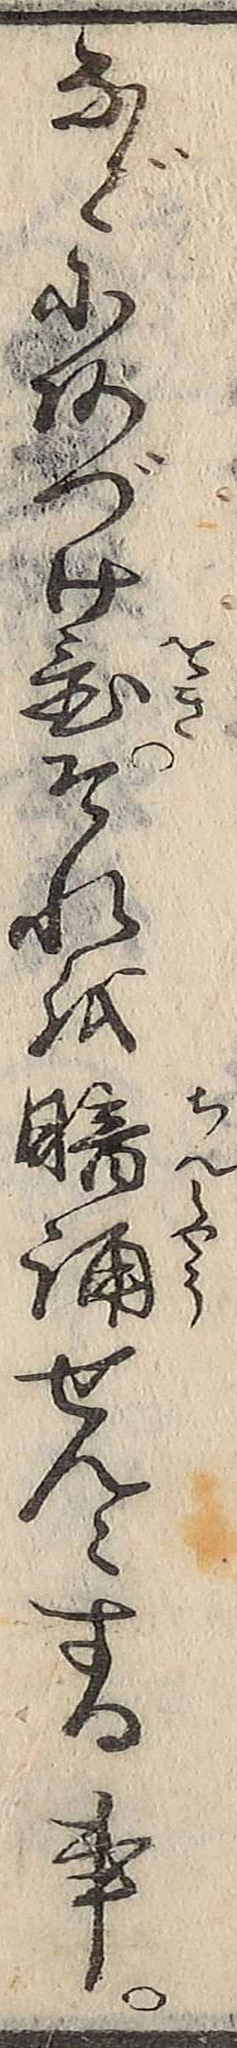などにあづけ置。それを暗誦せんとする事。
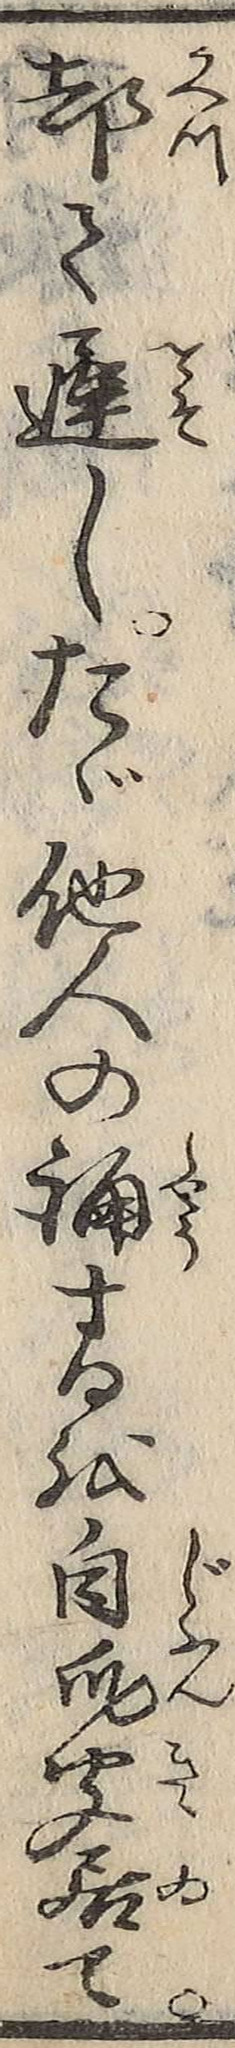却て遅し。たゞ他人の誦するを自身聞居て。
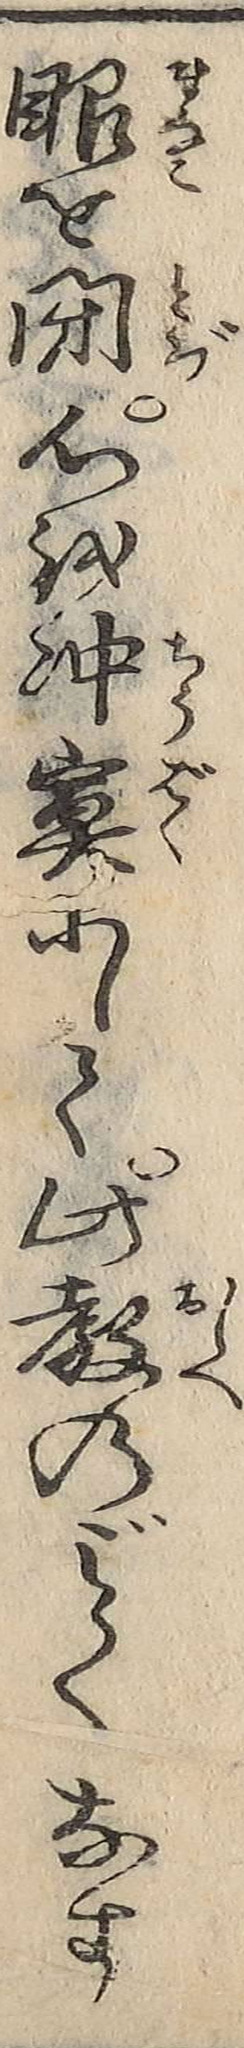眼を閉。心を沖寞にして。此教のごとくなす
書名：物覺秘傳
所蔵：神戸大学附属図書館 国文学研究資料館
